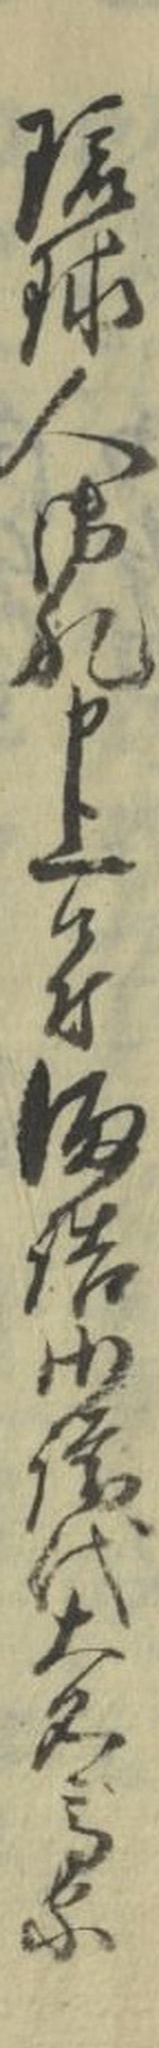琉球人御礼申上候付溜詰御譜代大名高家
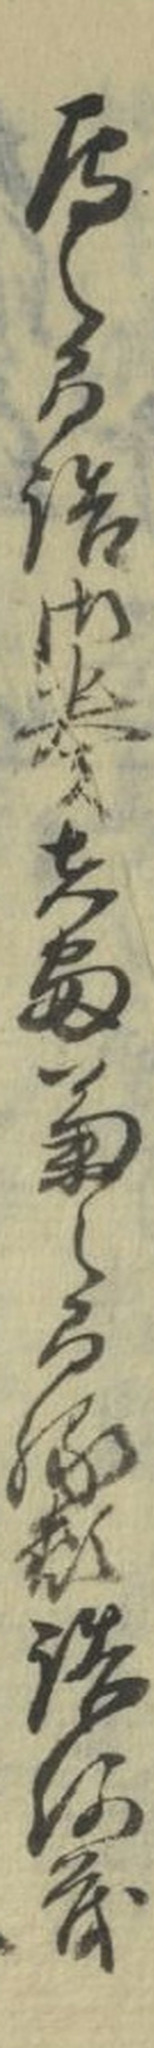鴈之間詰御奏者番菊之間縁頬詰何も
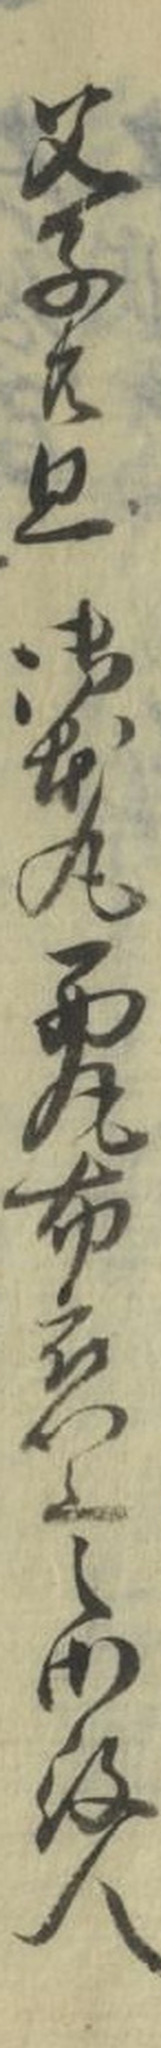父子共且御本丸西丸布衣以上之御役人
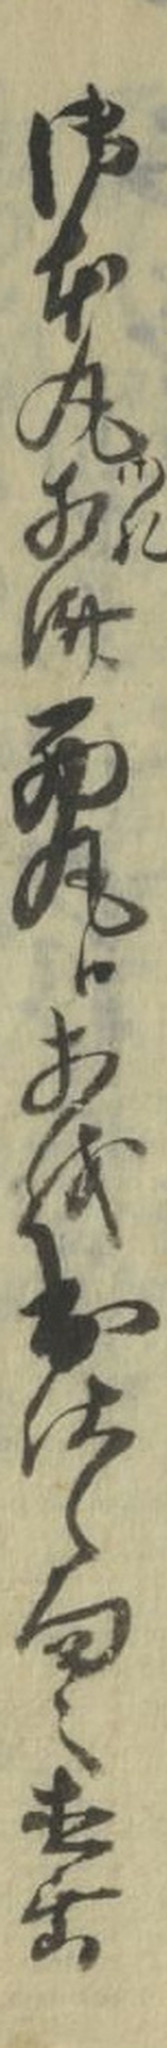御本丸御礼相済西丸え相越出仕之向之直垂
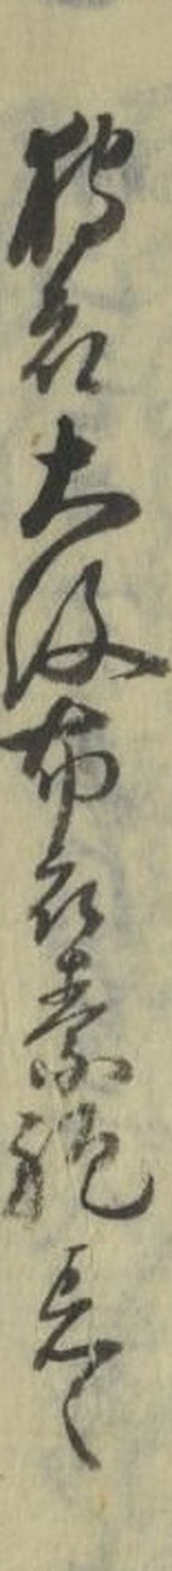狩衣大紋布衣素袍着之
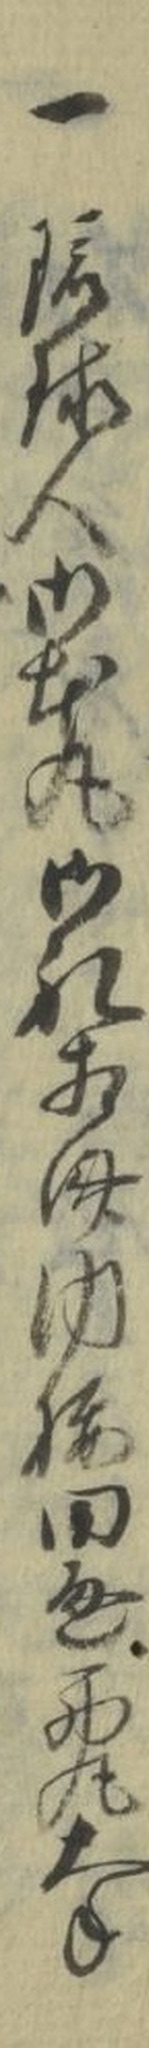一琉球人御本丸御礼相済内桜田通西丸大手
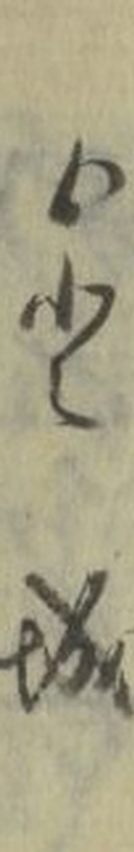ゟ登城
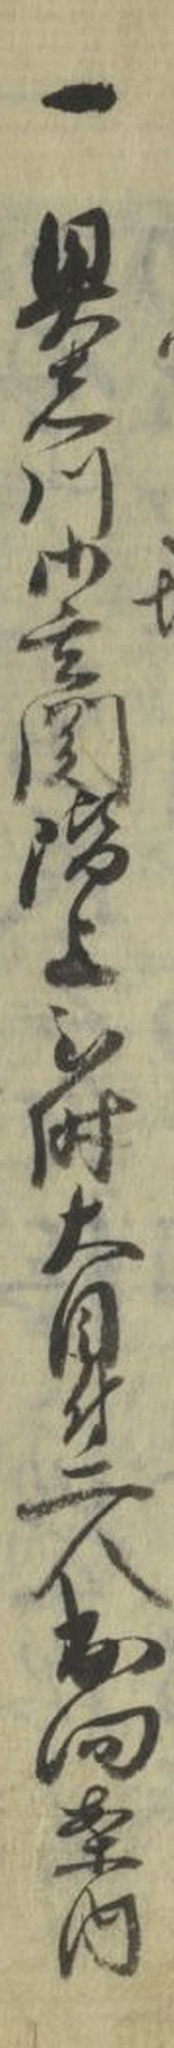一具志川御玄関階上至時大目付二人出向案内

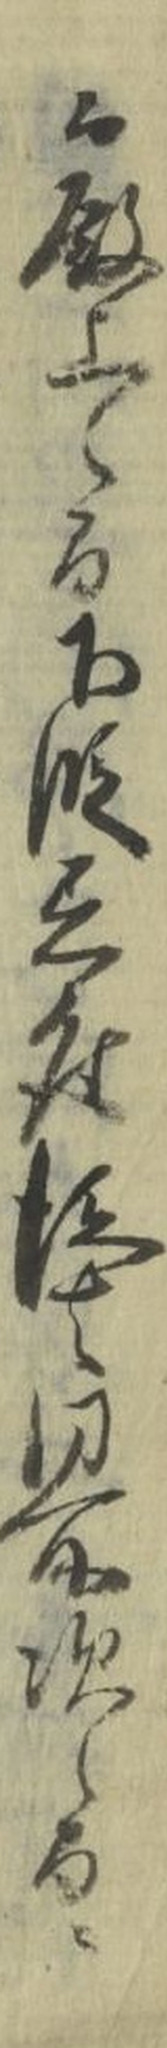而殿上之間下段着座従者同所次之間に
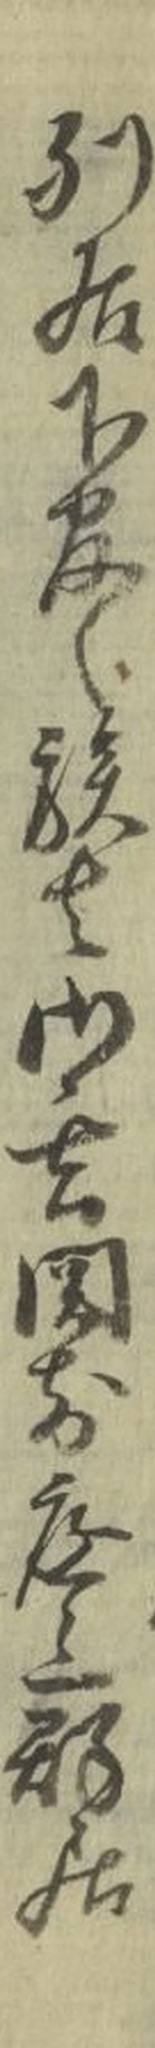列居下官之族は御玄関前庭上群居
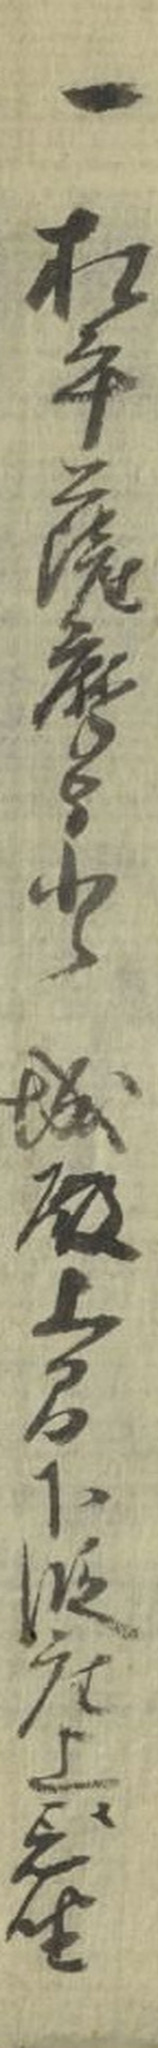一松平薩摩守登城殿上間下段座上に着座
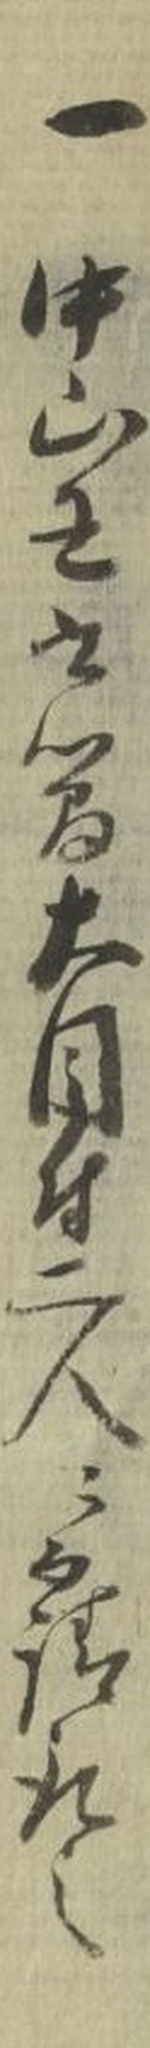一中山王書簡大目付二人にて請取之
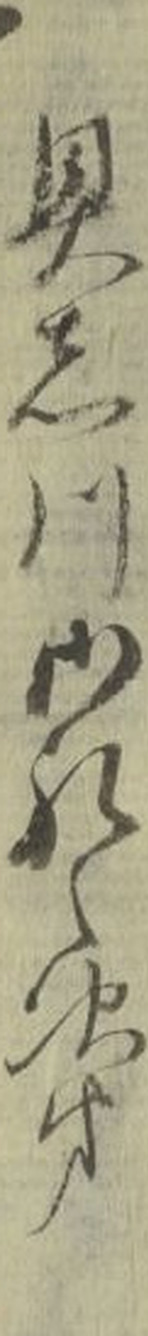具志川御礼之次第
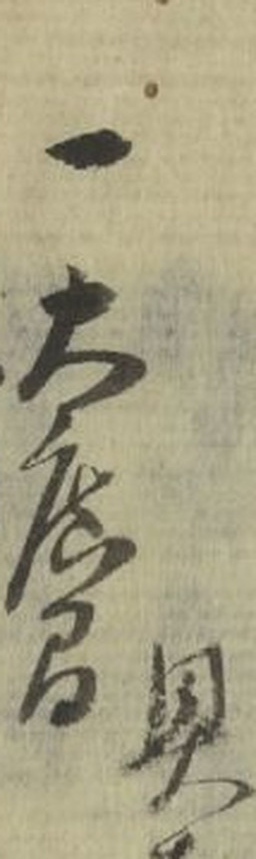一大広間
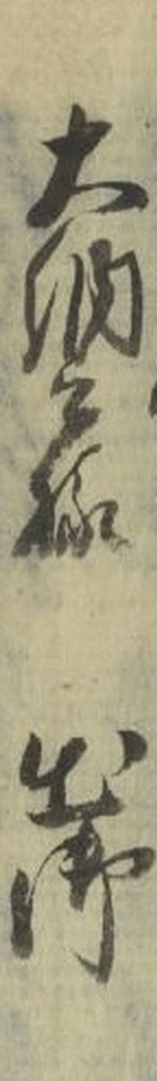大納言様出御
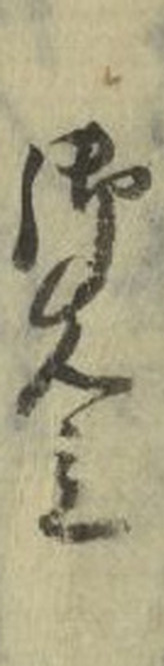御先立
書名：戊辰琉球人来朝之式 全
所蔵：University of the Ryukyus Library
